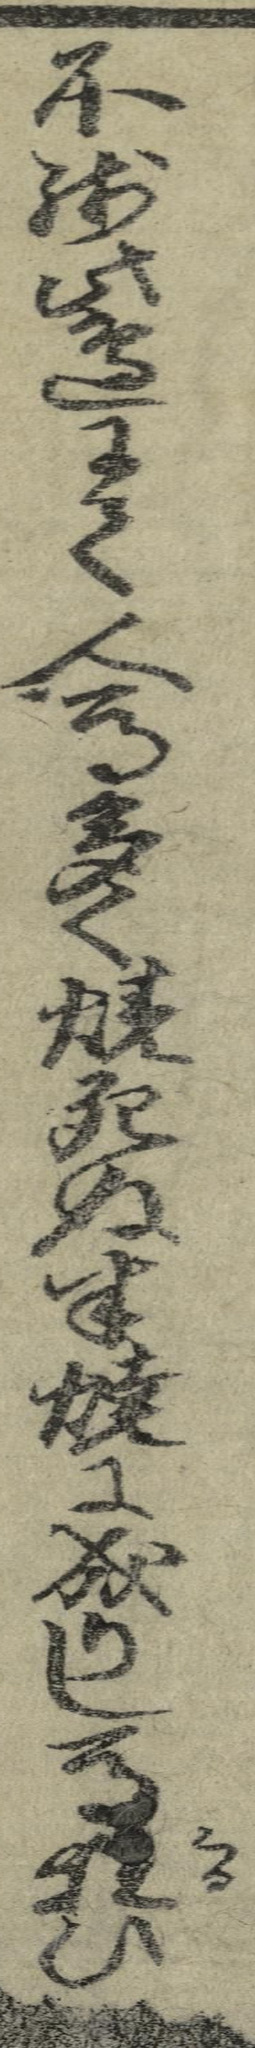不残此辺にて人馬多く焼死ぬ半焼に成りし馬狂ひ
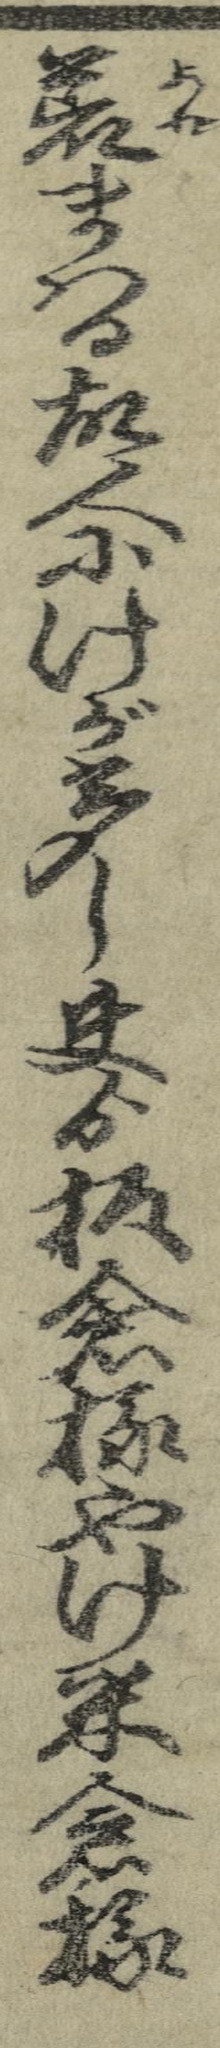荒まハる故人にけが多し夫ゟ板倉様やけ米倉様
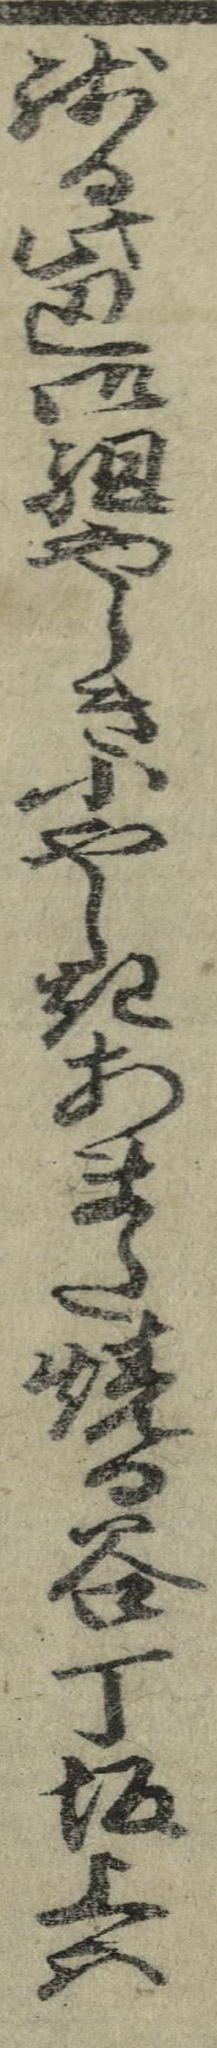残る此辺御組やしき小やしきあまた焼る谷丁坂上ハ
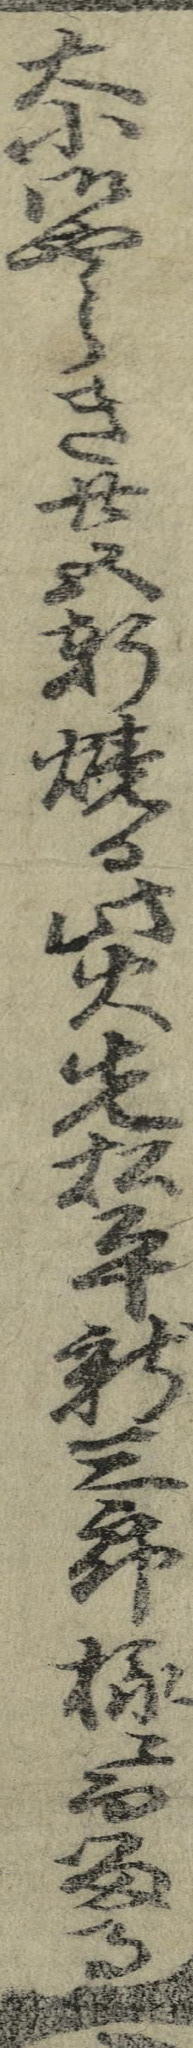大小御やしき廿五軒焼る此火先松平新三郎様二而留る
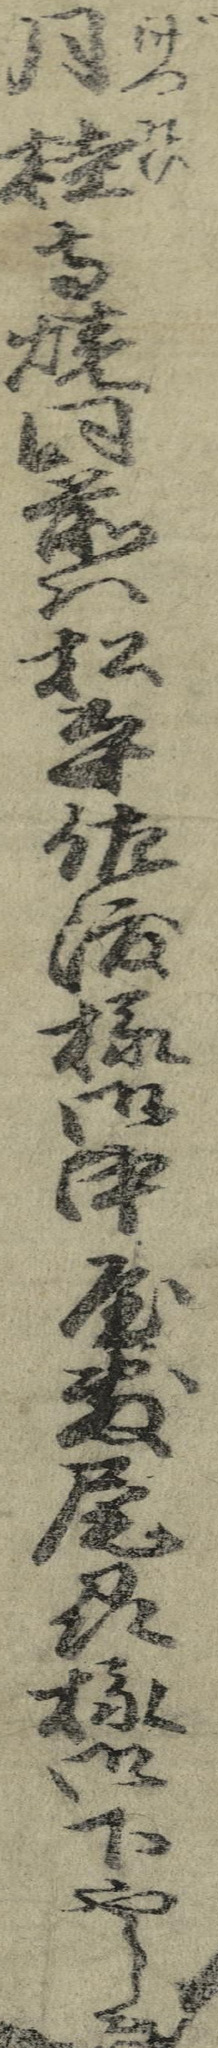月桂寺焼同前ハ松平佐渡様御中屋敷尾州様御下やしき
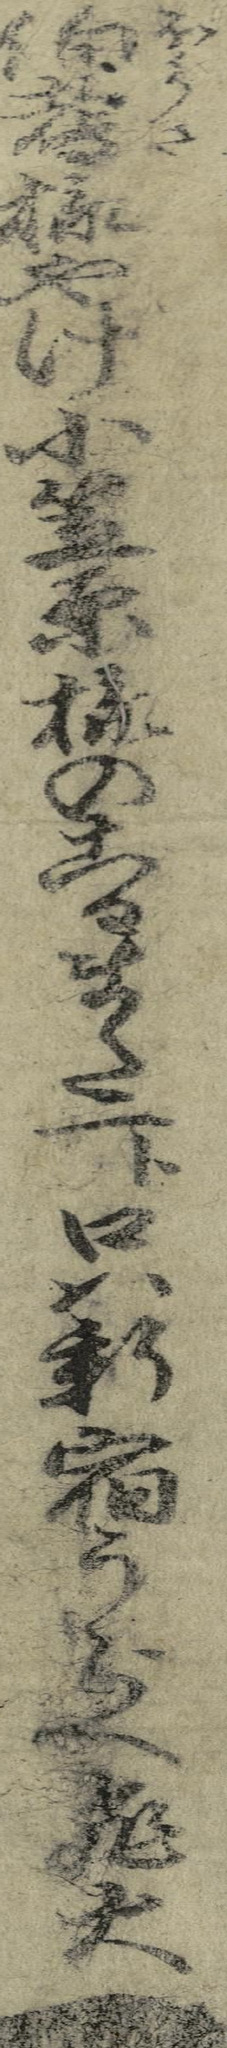伯耆様やけ小笠原様のこるまた一ㇳ口ハ新宿うらへ飛火
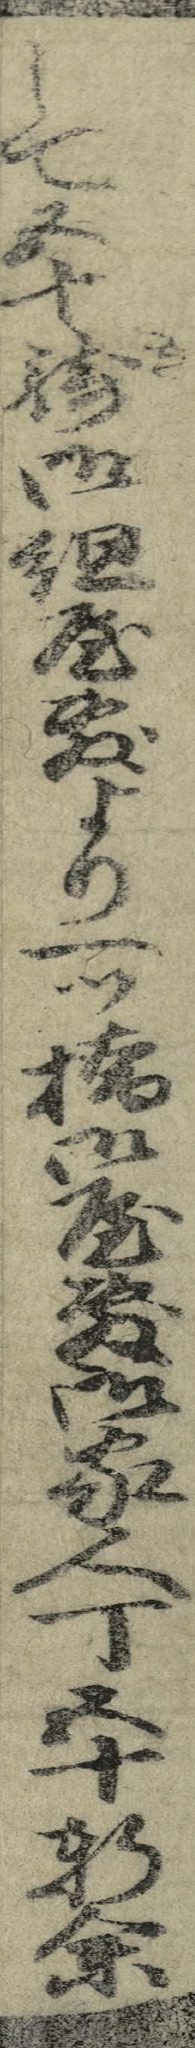して五十騎御組屋敷より一ッ橋御屋敷御家人丁五十軒余
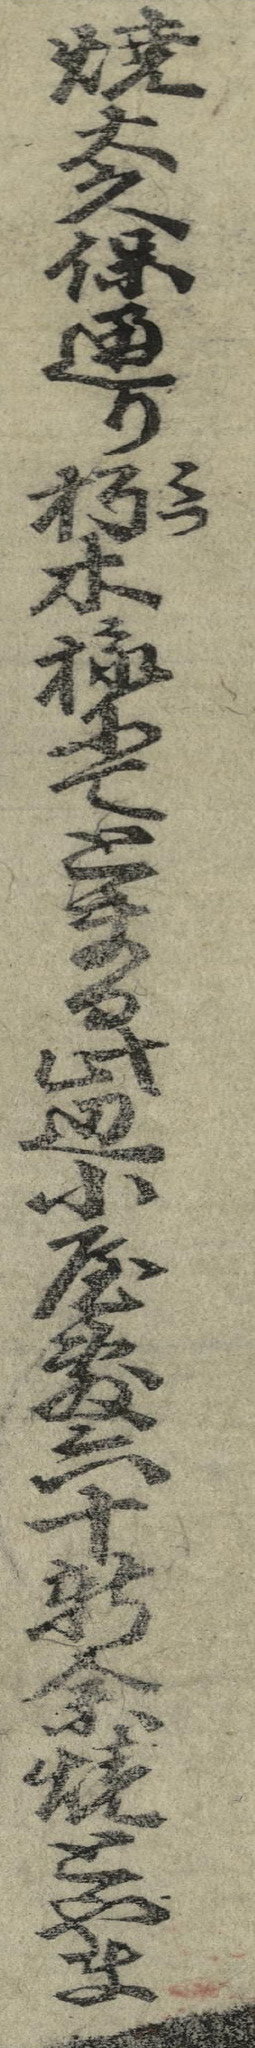焼大久保通り朽木様にてとまる此辺小屋敷六十軒余焼とやま
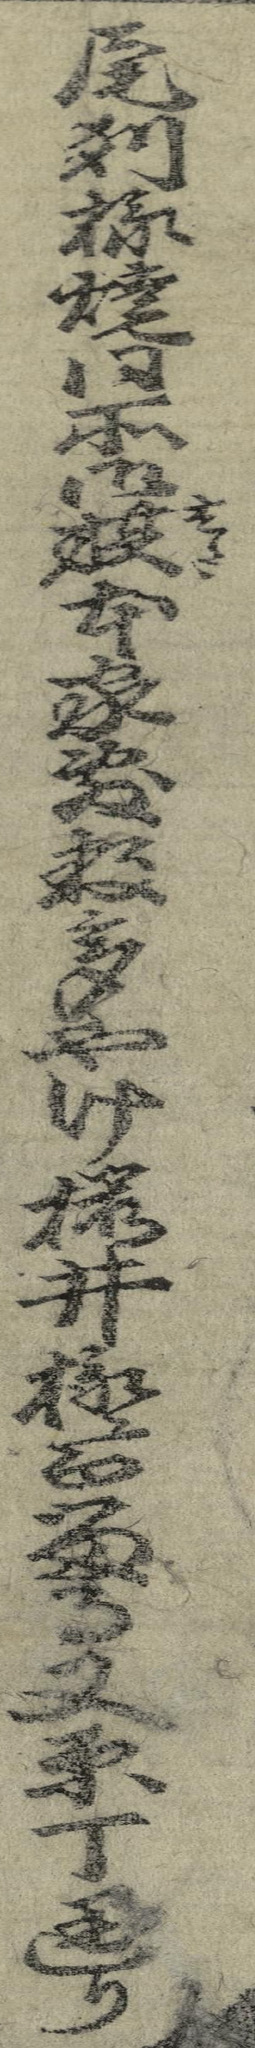尾州様焼同所御旗本家敷数多やけ桜井様二而留る又原丁通り
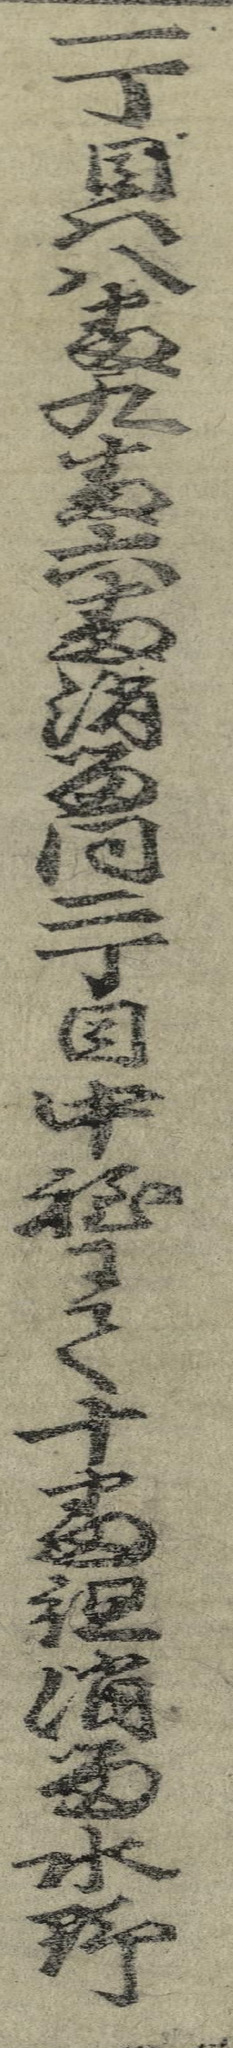一丁目ハ八番九番六番消留同二丁目中程にて十番組消留水野
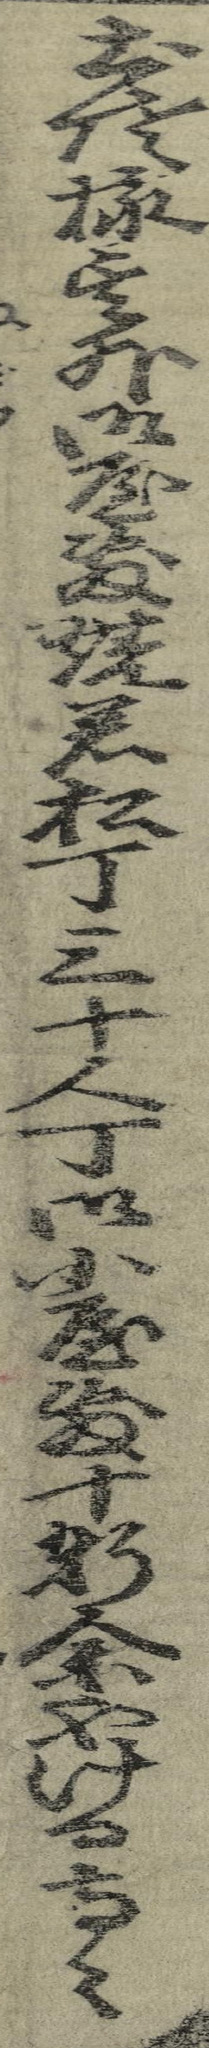豊後様其外御屋敷焼若松丁三十人丁御小屋敷十軒余やける寺々
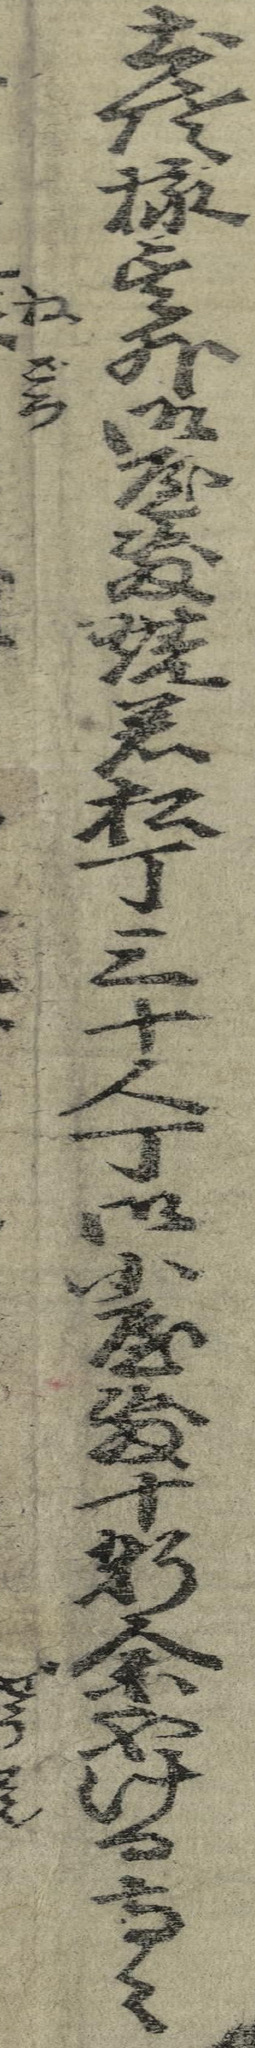豊後様其外御屋敷焼若松丁三十人丁御小屋敷十軒余やける寺々
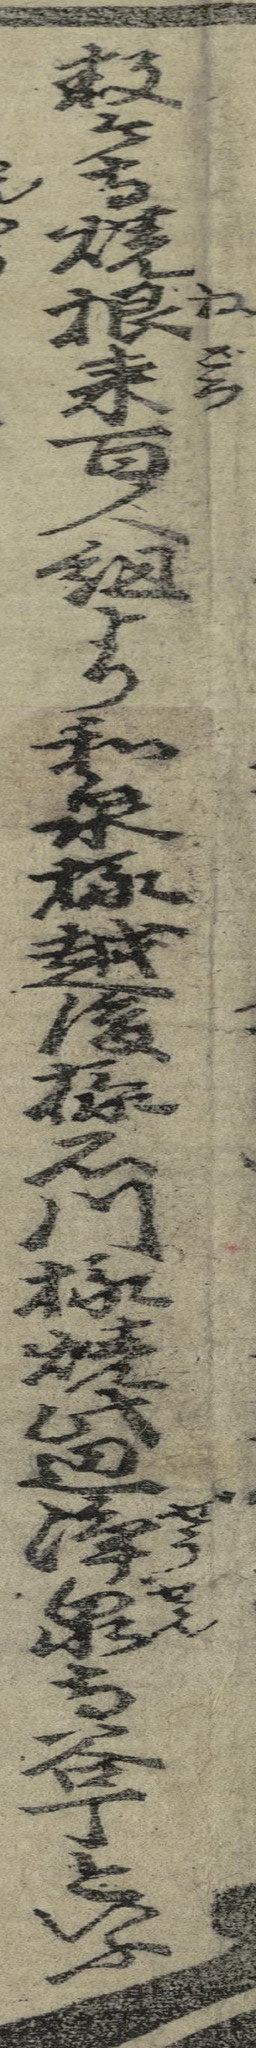数ヶ寺焼根来百人組より和泉様越後様石川様焼此辺淨泉寺谷丁といふ
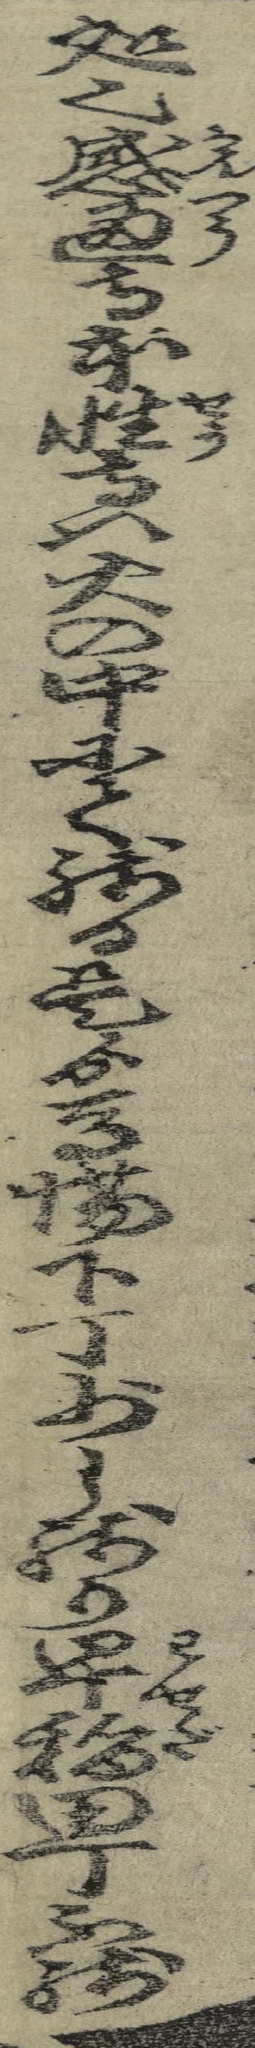処也感通寺本性寺ハ火の中にて残る是ゟ馬場下丁少し残り早稲田丁不残
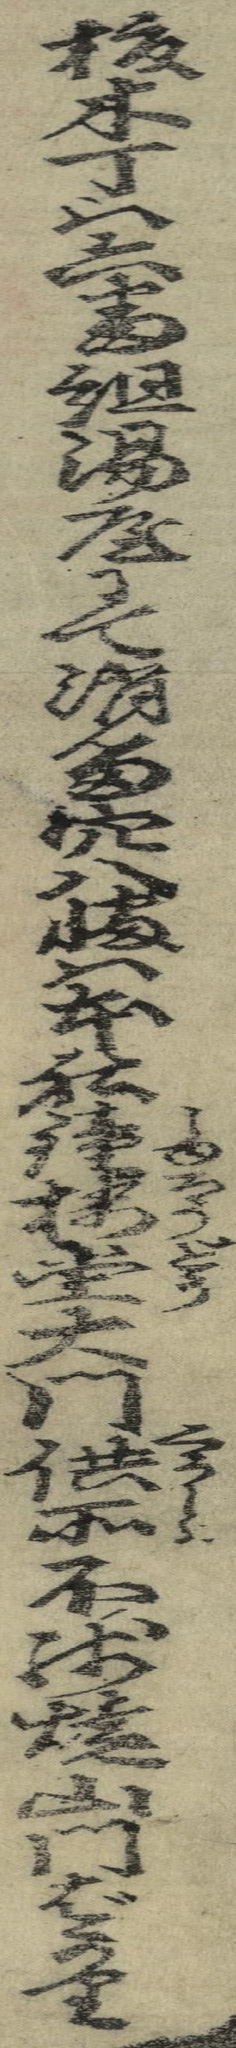板木丁ハ六番組湯屋にて消留穴八幡ハ本社鐘楼堂大門供所不残焼山門ばかり
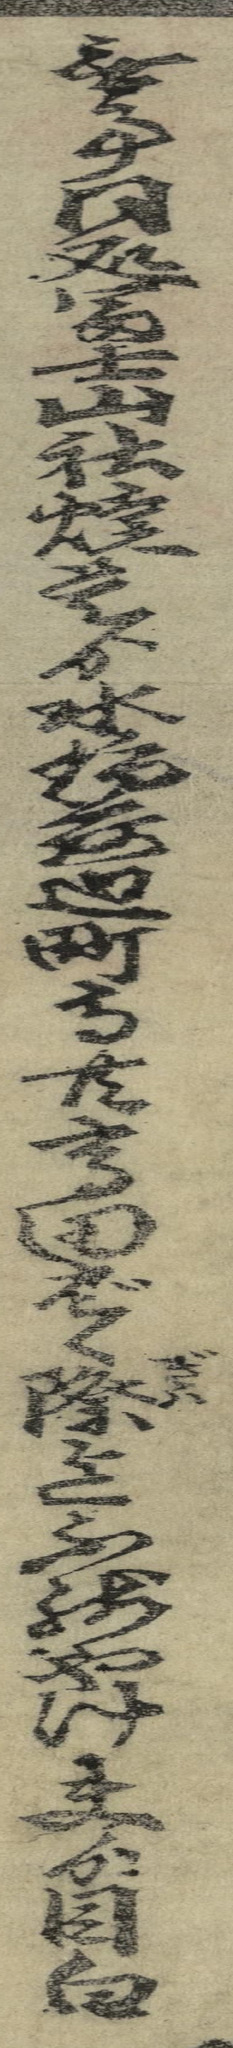無事同処富士山社焼是ゟ水稲荷辺町寺共高田ばゝ際迄不残やけ夫ゟ目白
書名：安政六未歳二月廿一日青山大火場所附
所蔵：東京大学地震研究所図書室 Earthquake Research Institute Library, The University of Tokyo, JAPAN
